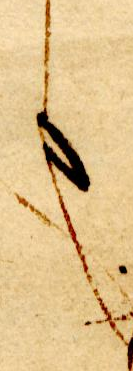To
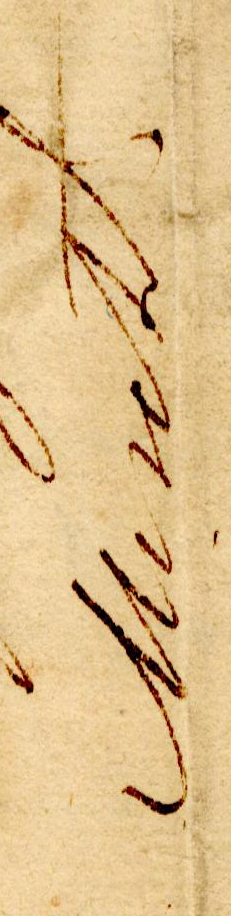Merch^t
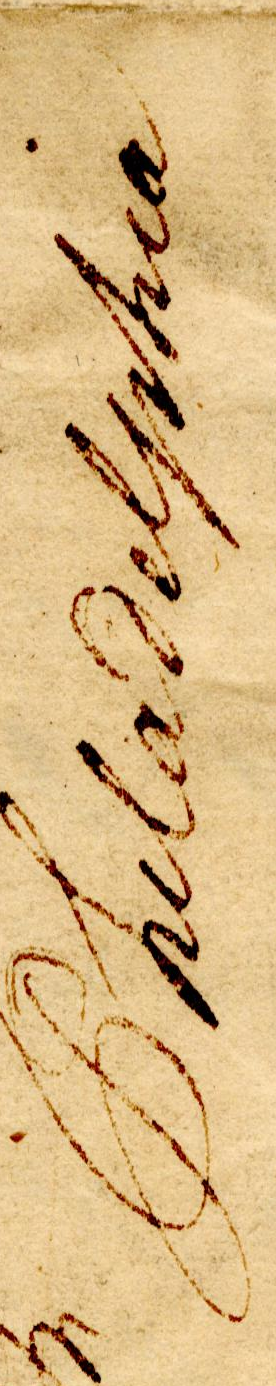Philadelphia
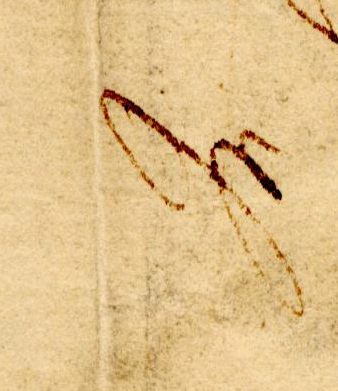In
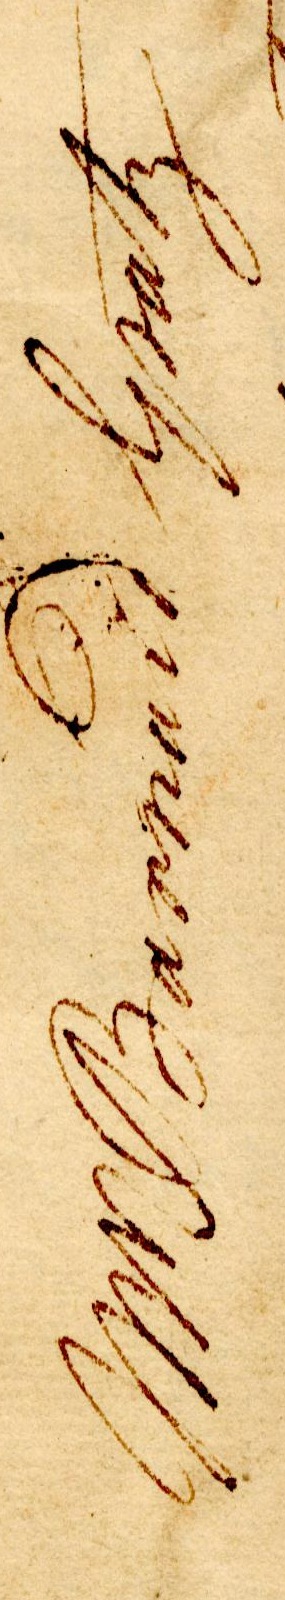M^r Barnard Gratz
